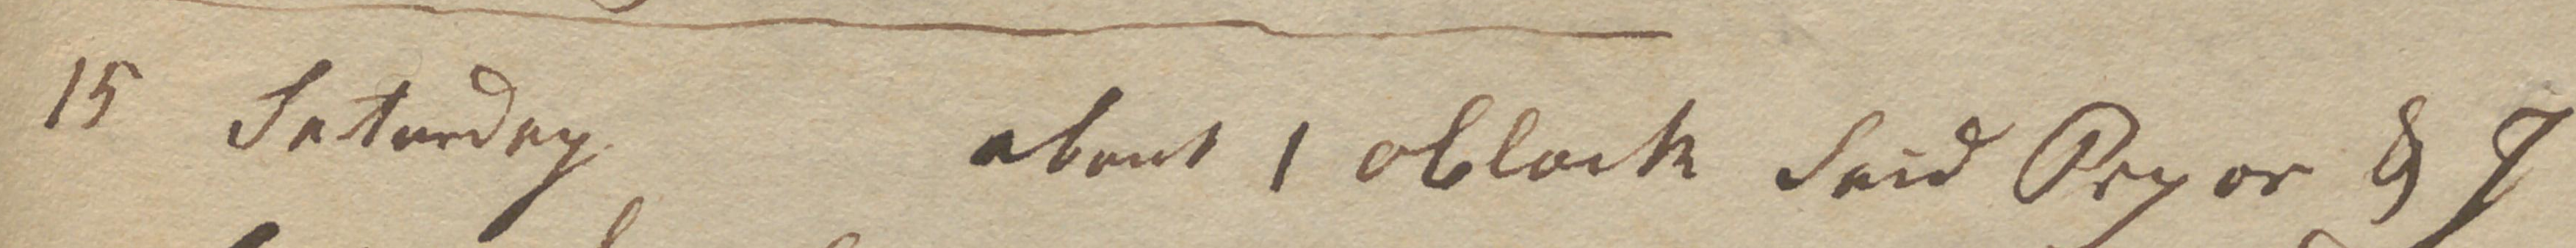15 Saturday about 1 oClock Said Pryor & I
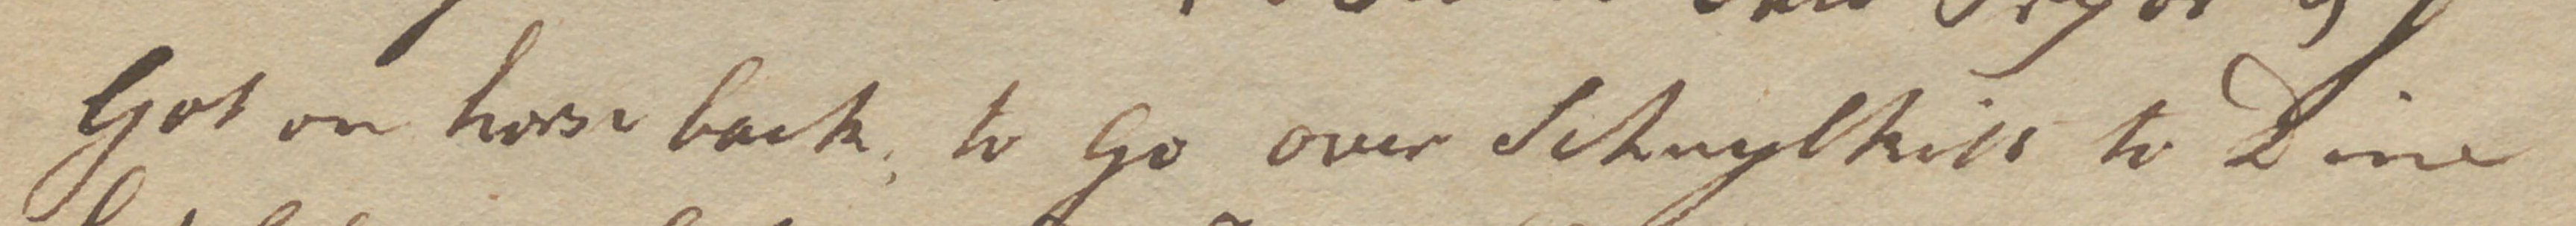Got on horse back to Go over Schuylkill to Dine
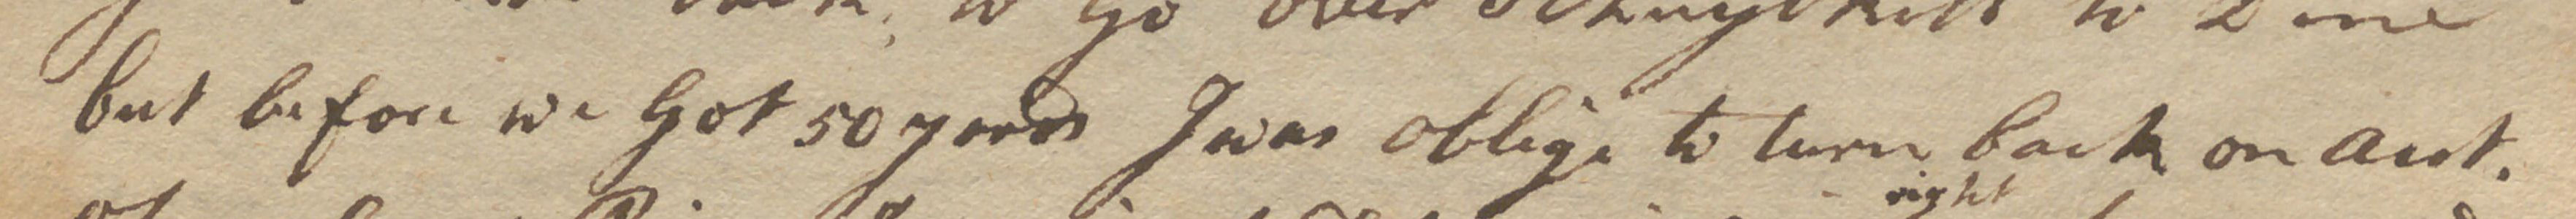but before we Got 50 yards I was oblige to turn back on Acct.
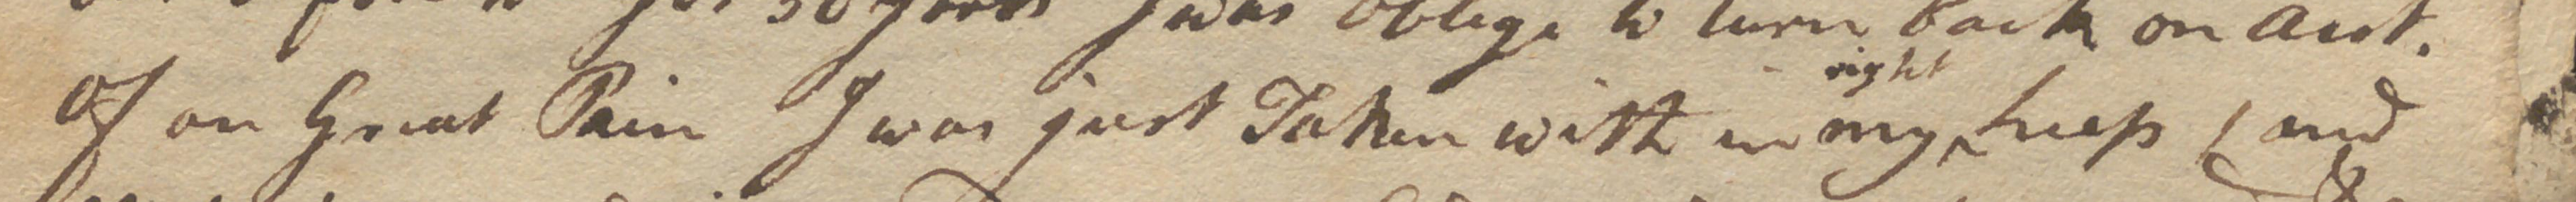of on Great Pain I was just Taken with in my ^ heep, and
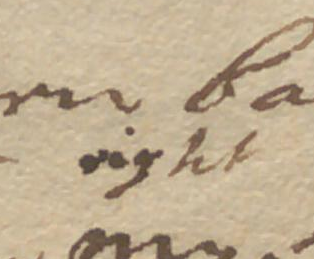right
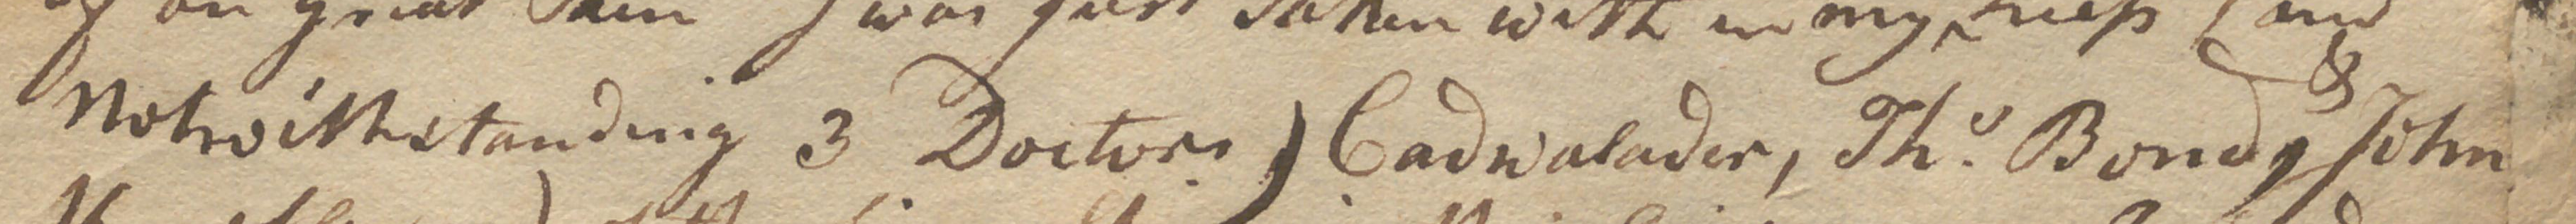Notwithstanding 3 Doctors) Cadwalader, Th^s. Bondy John
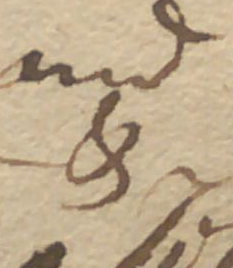&
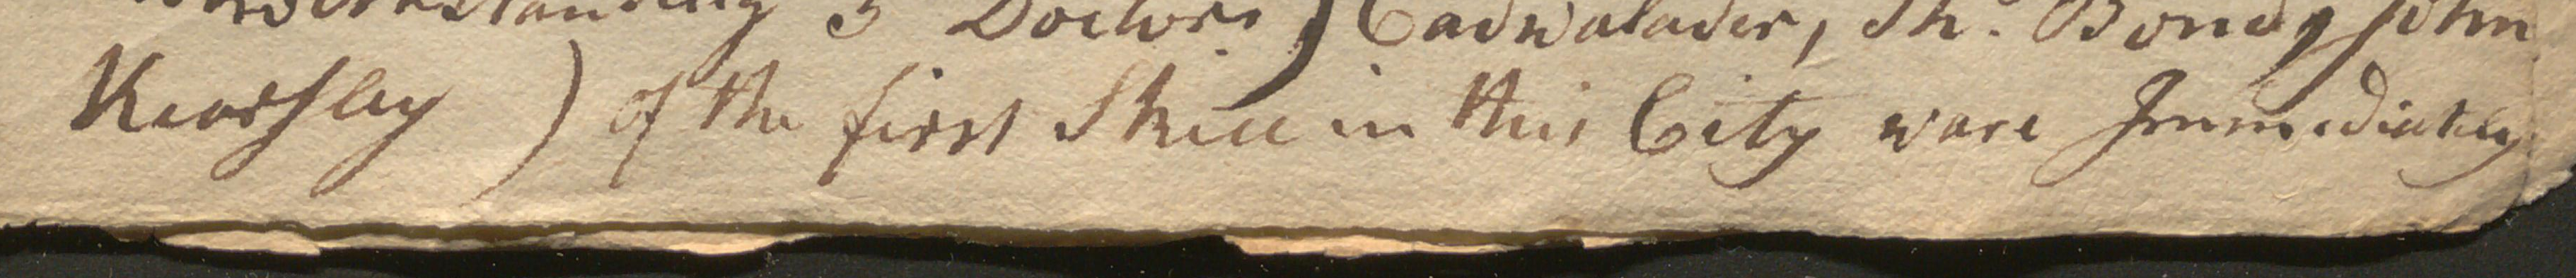Kearsley) of the first Skill in this City ware Immediately
